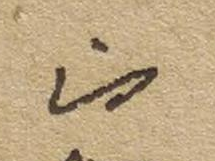is
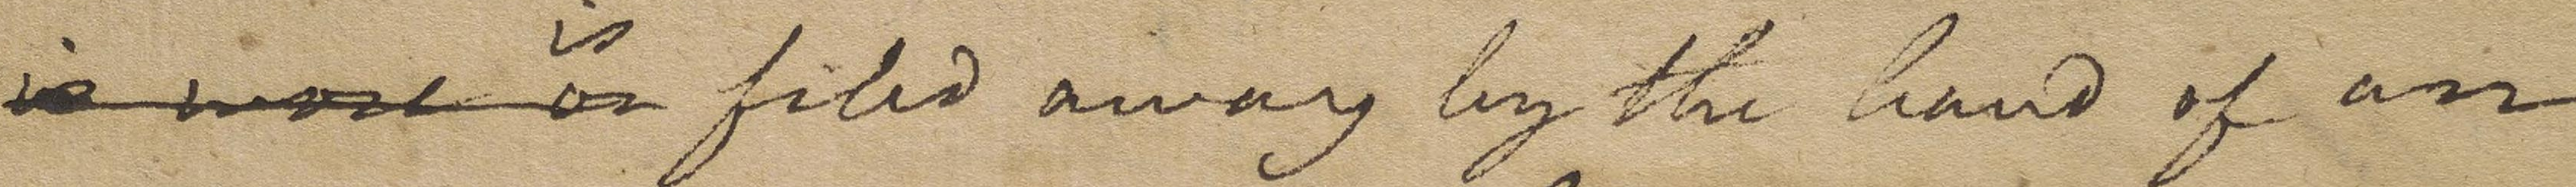[is more or] filed away by the hand of an
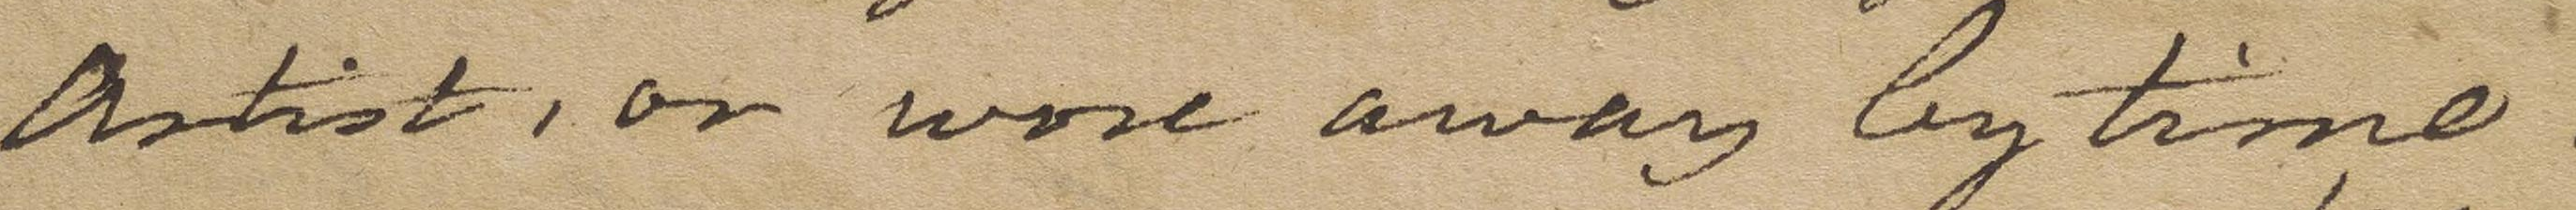artist, or wore away by tie
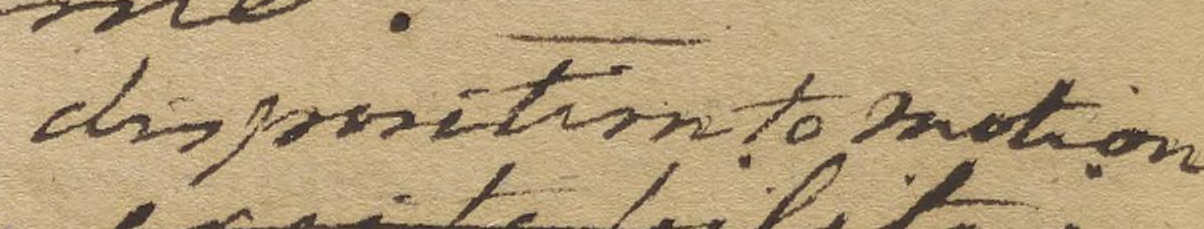disposition to motion
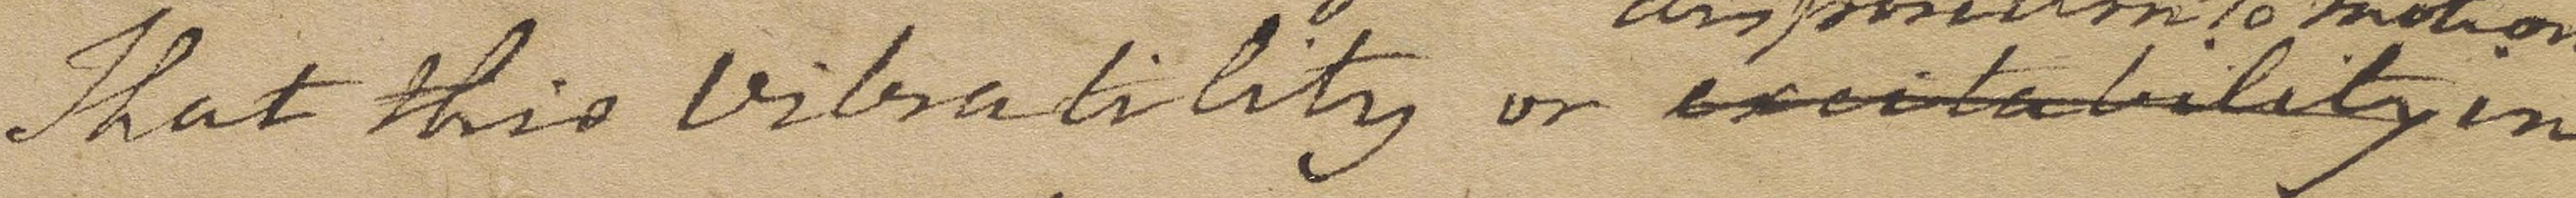That this vibratility or [excitability] in
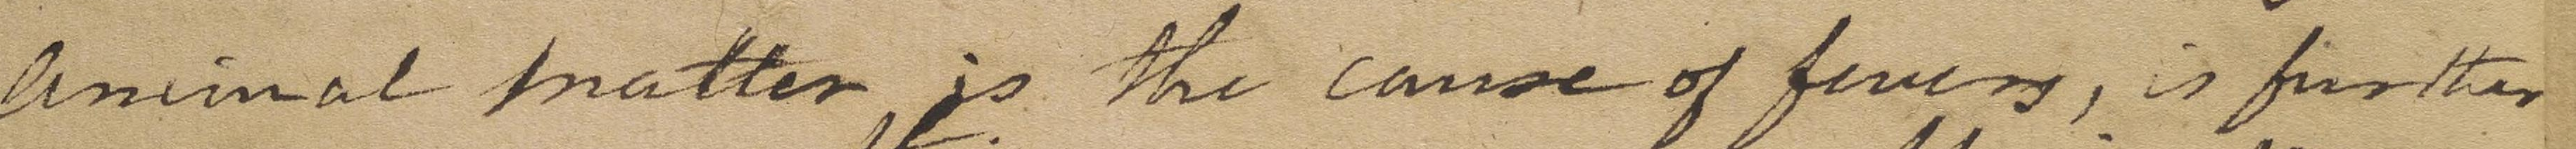animal matter is the cause of fevers, is further
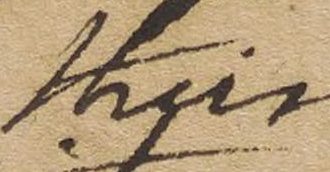their
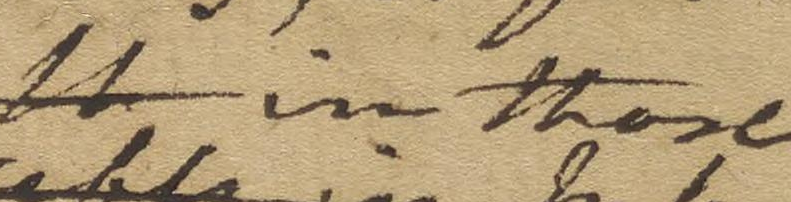[At] in those
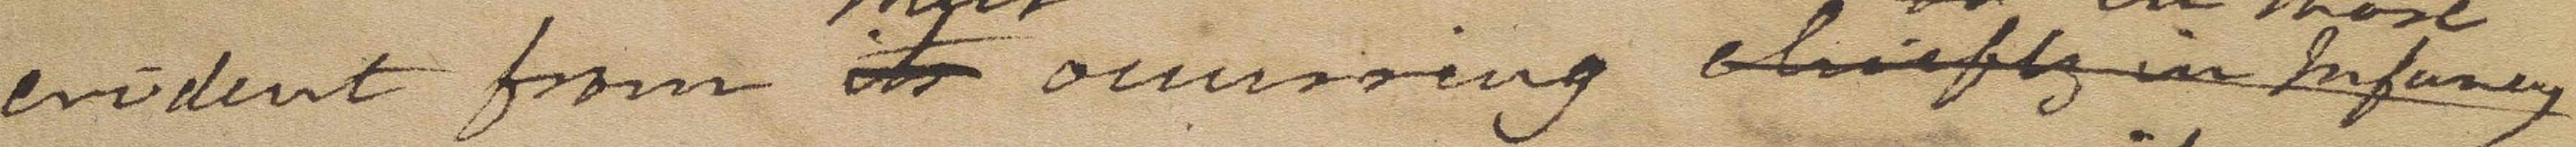evident from [its] overseeing chiefly in infancy
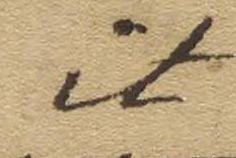it
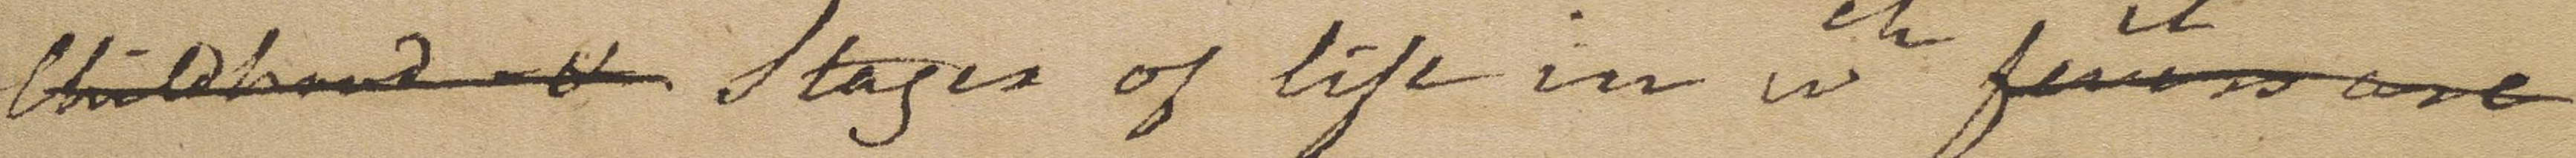[Childhood- &] stages of life in w^ch [fevers are]
